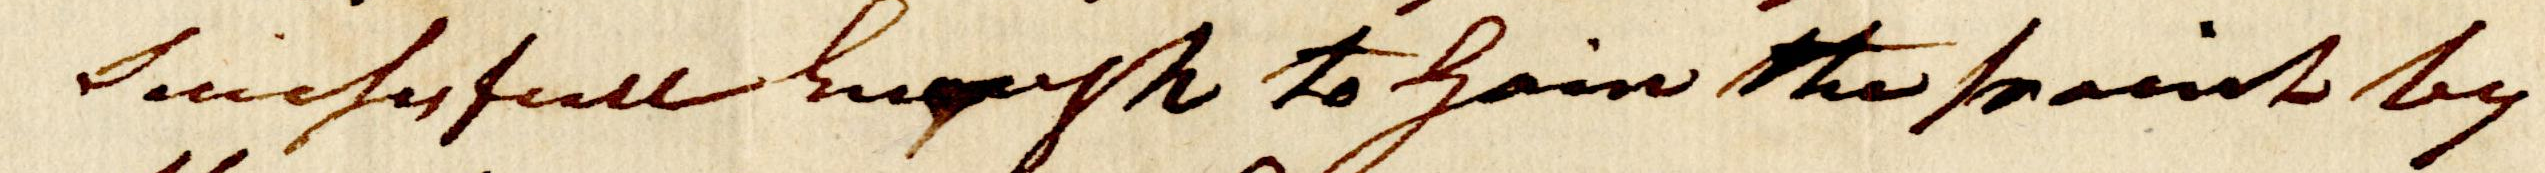Sucsessful [_____] to Gain the promis by
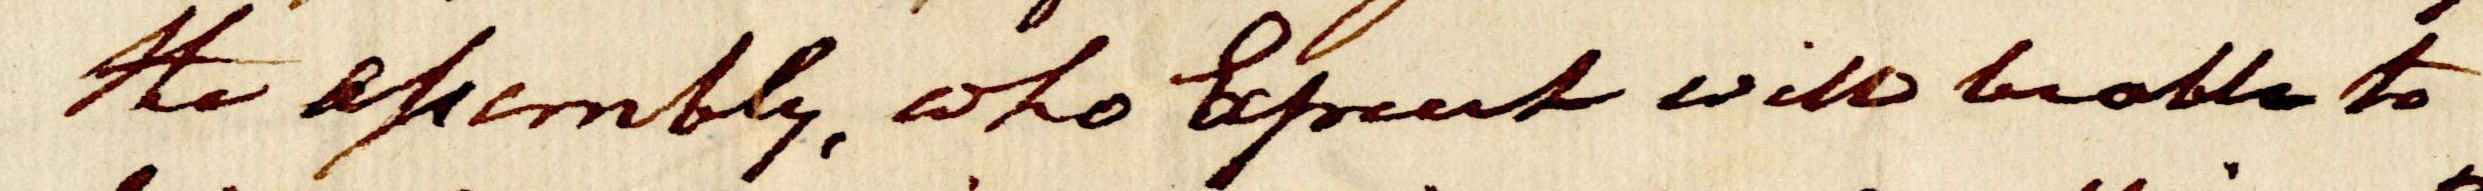the assembly, who expect will be able to
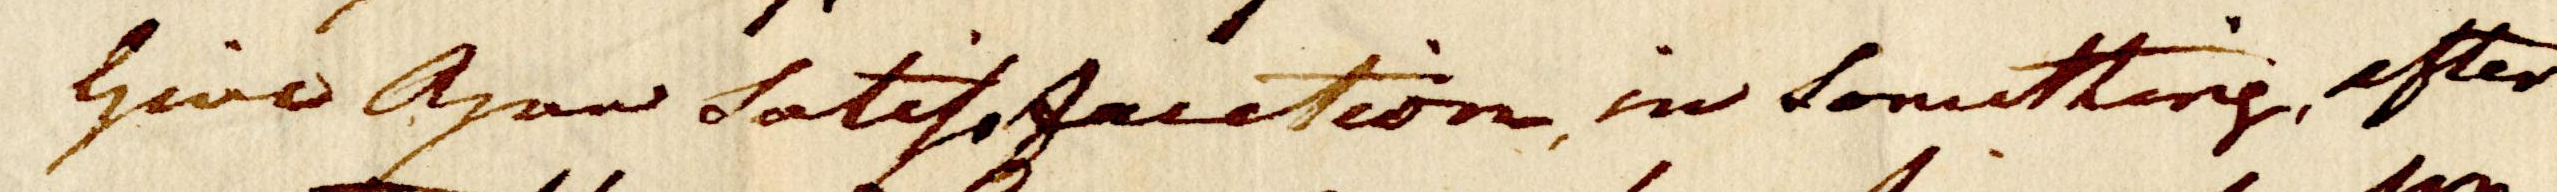Give you Satisfaction in Something, after
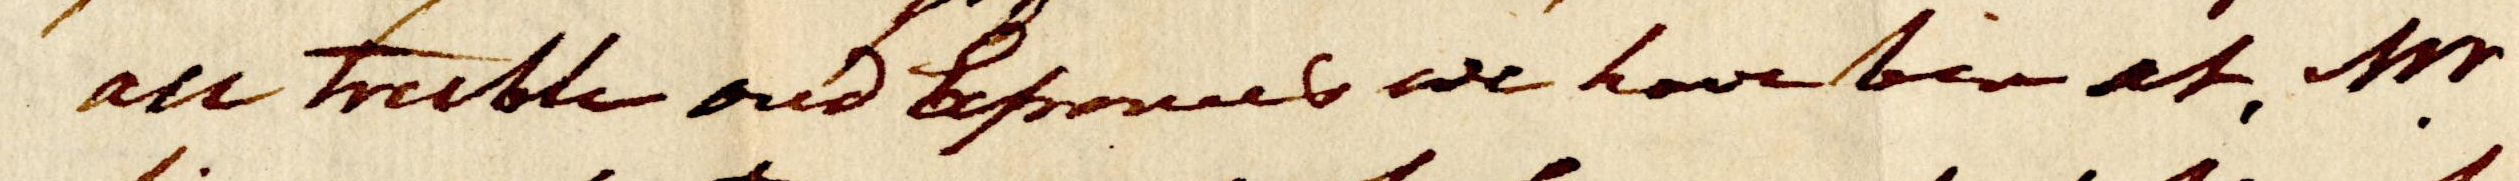all truble and expenses we have bin at, M^r
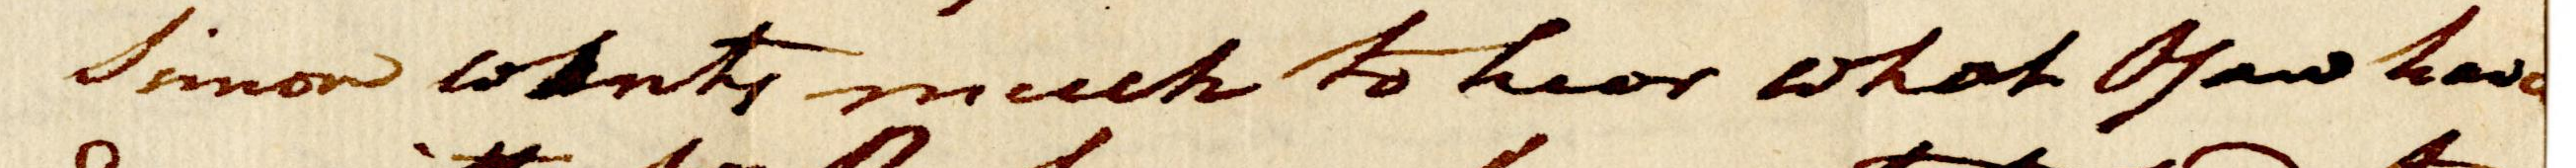Simon wants much to hear what you have
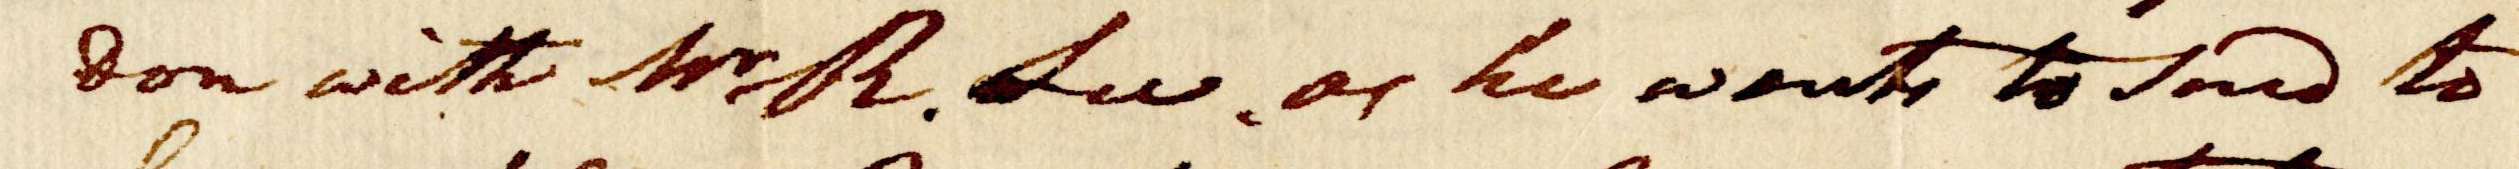don with M^r R. Lee, as he wants to send to
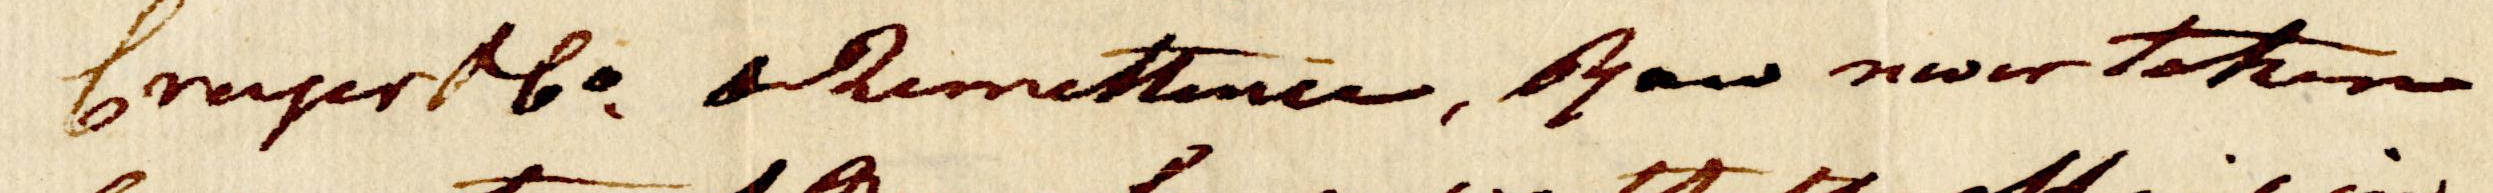Crager & Co a Remittance, you never thken
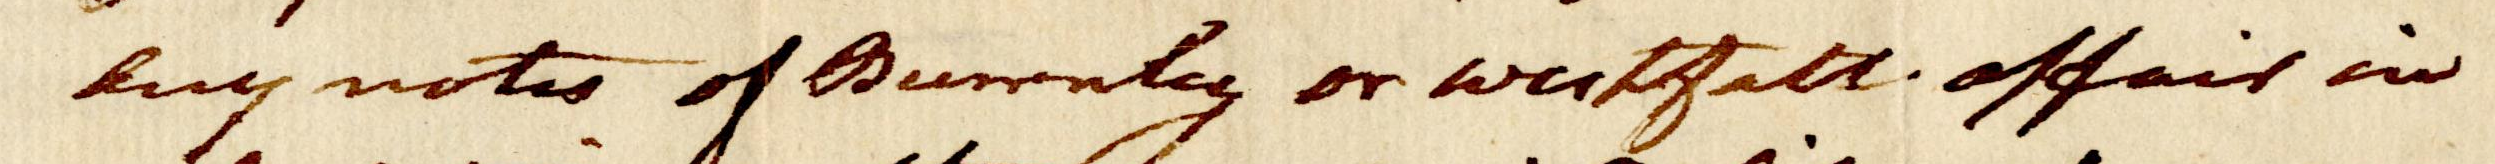my notes of Burnby or Westfall affair in
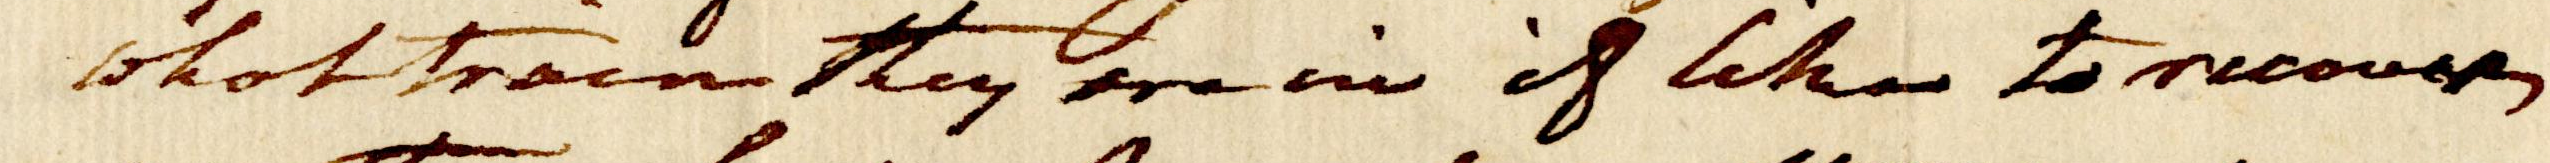what train they [___] in if like to recover
